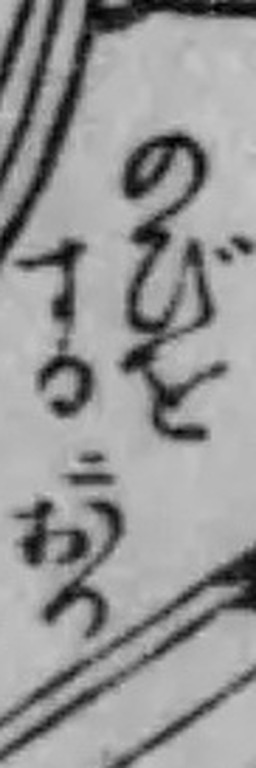するにおか
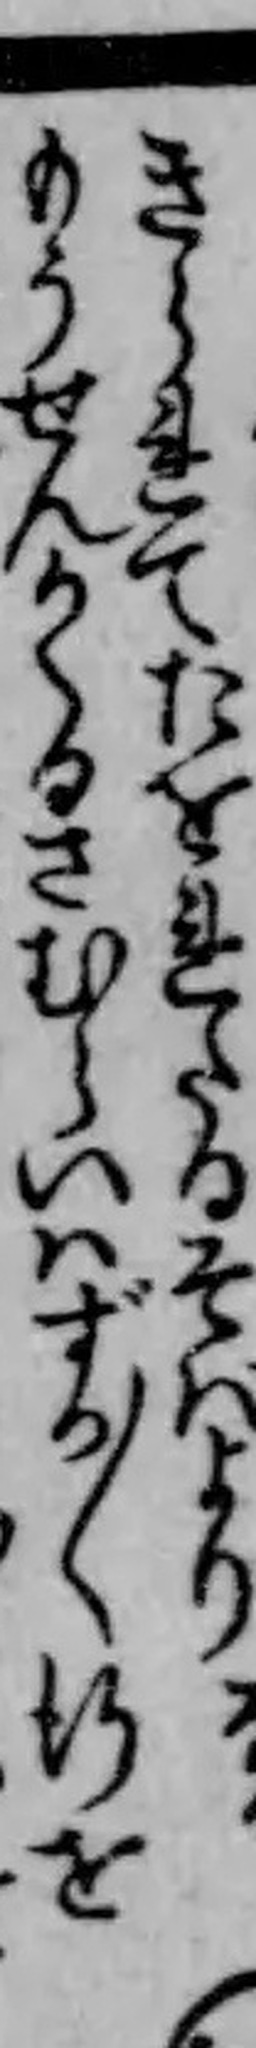もうせんかくるさむらいはずる〳〵行を
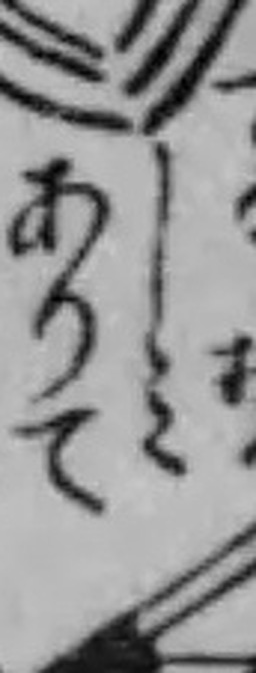ありて
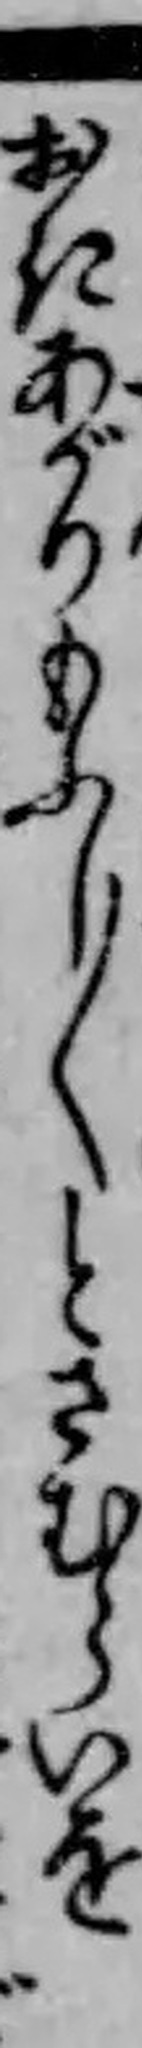おにあがりもふし〳〵とさむらいを
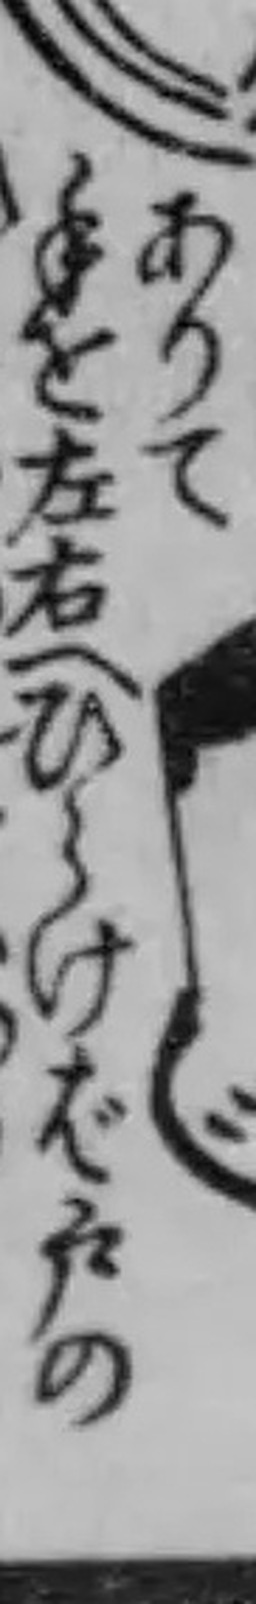手を左右へひらけば戸の
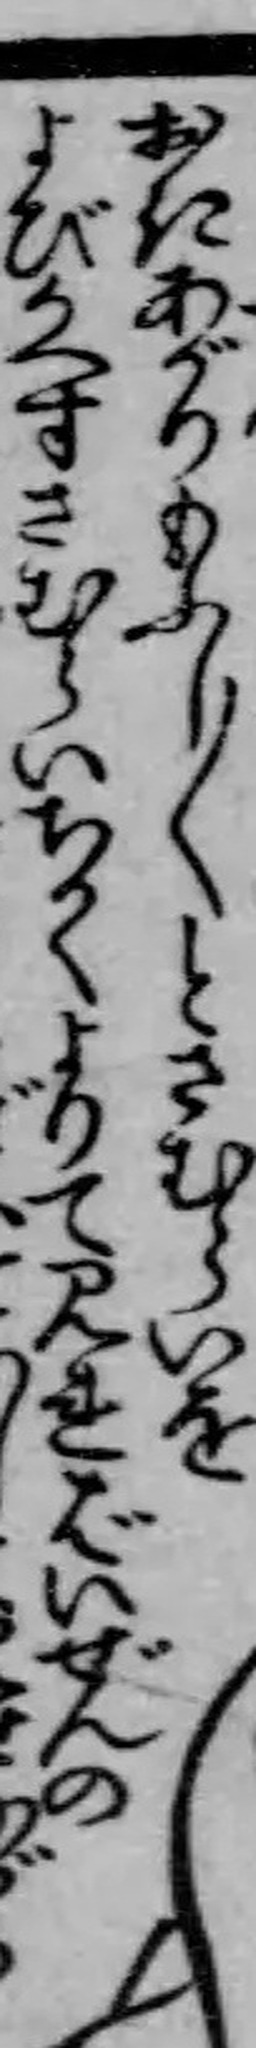よびかへすさむらいちかくよりて見ればいぜんの
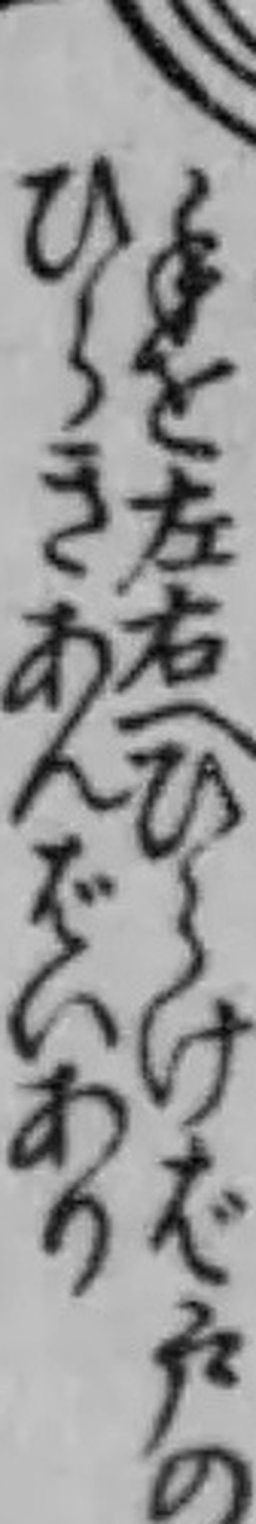ひらきあんばいあり
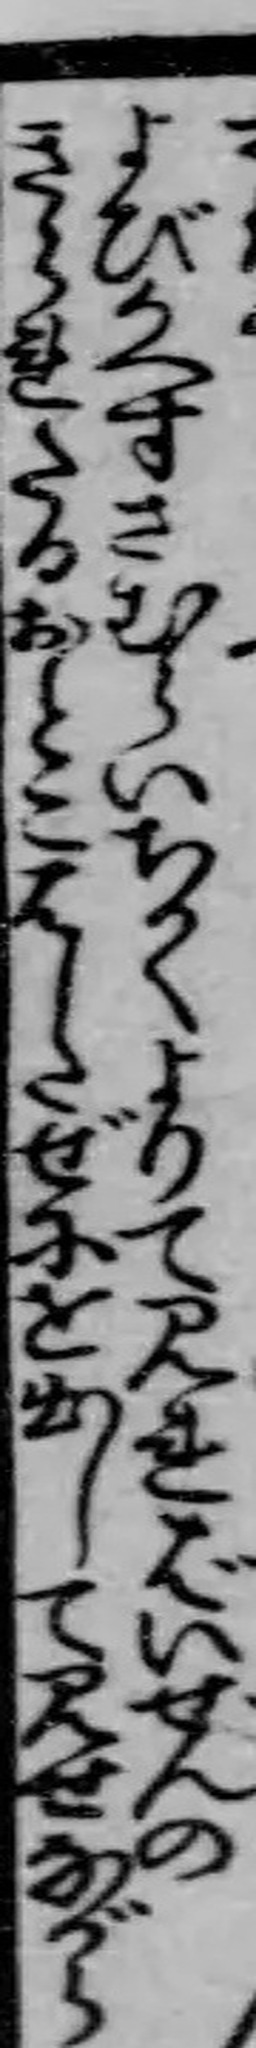きられたるおとこはしたぜにを出して見せながら
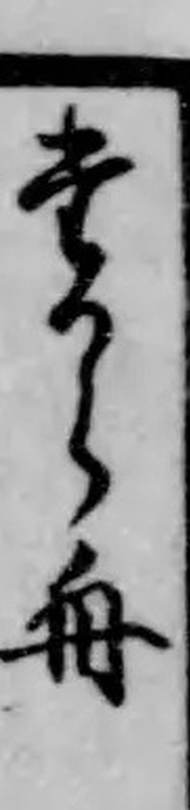たから舟
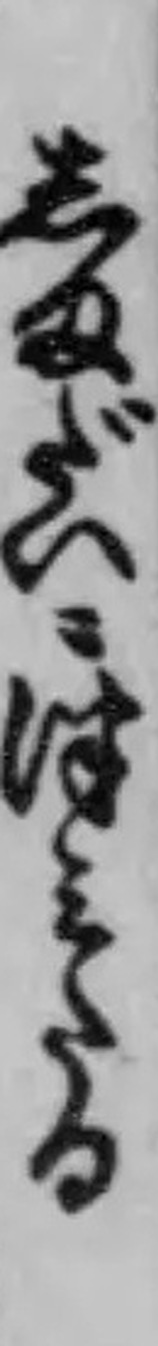しまだいにつみたる
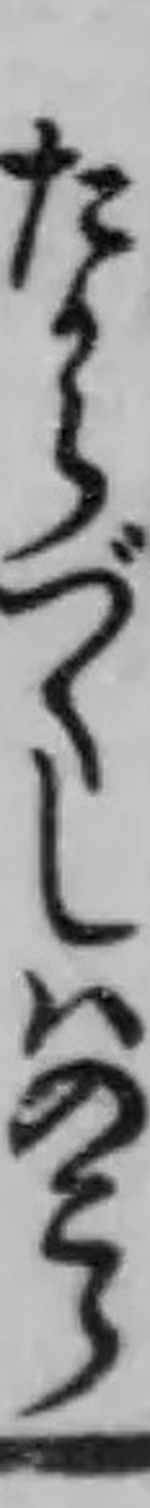たからづくしはのこら
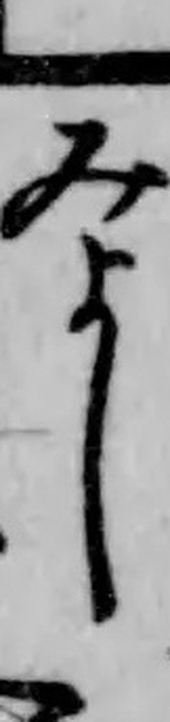みよし
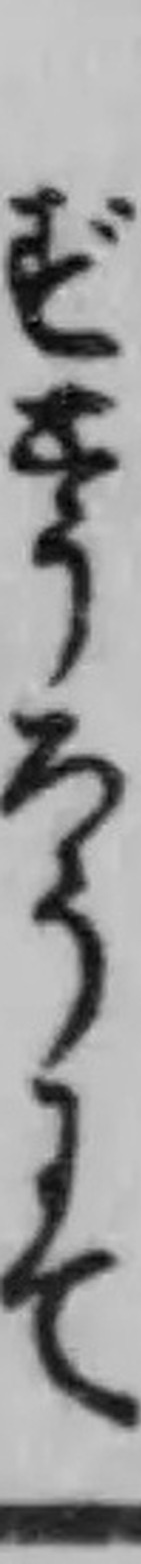ずとうろうにて
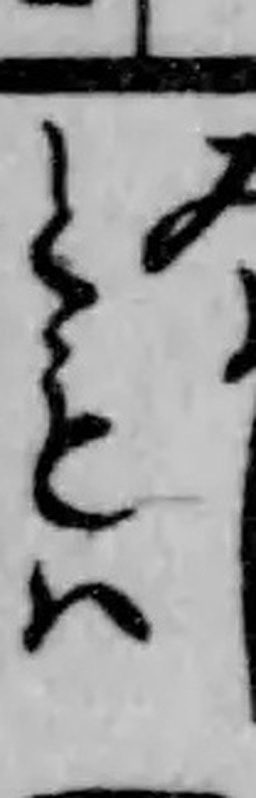ともは
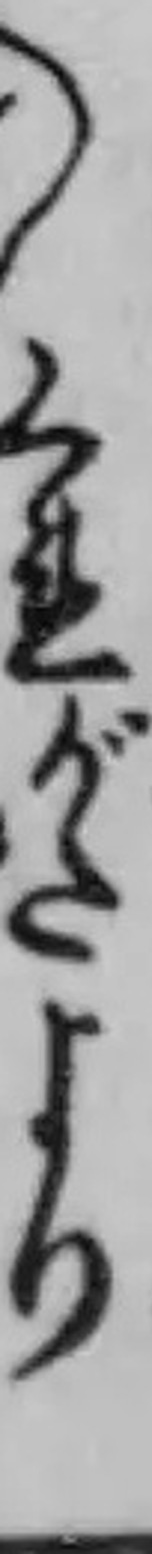くれがたより
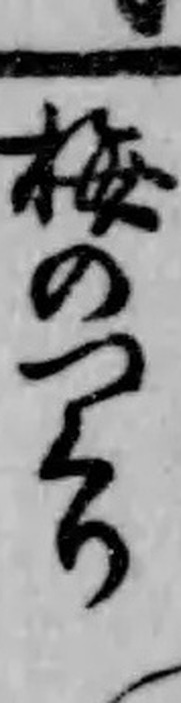梅のつくり
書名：明月余情. 第1編
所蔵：国立国会図書館 National Diet Library, JAPAN
